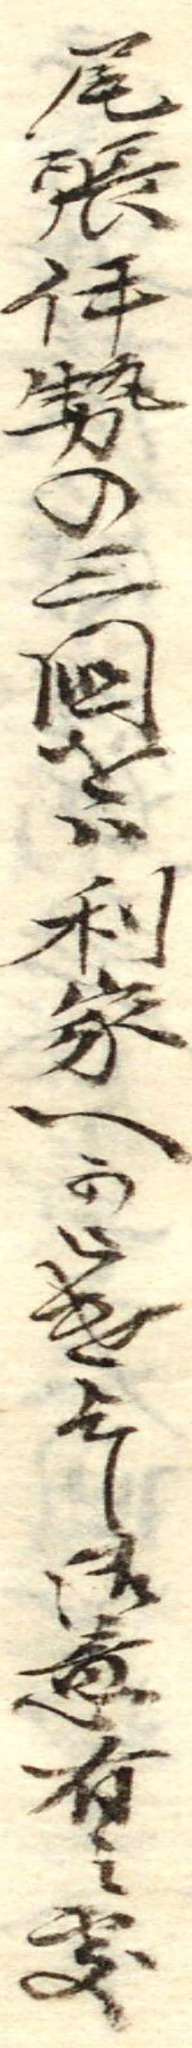尾張伊勢の三国をは利家へ可被遣与し御意有之處
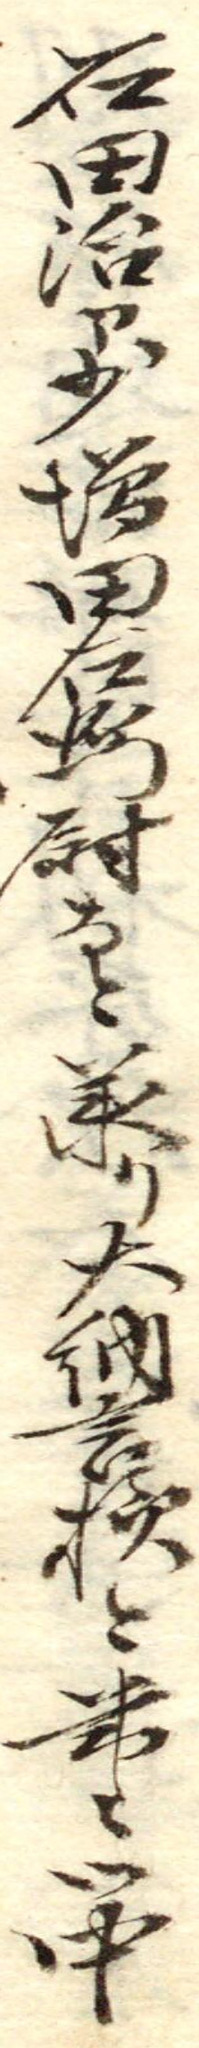石田治部少増田右衛門尉なと承り大納言様と節々御中
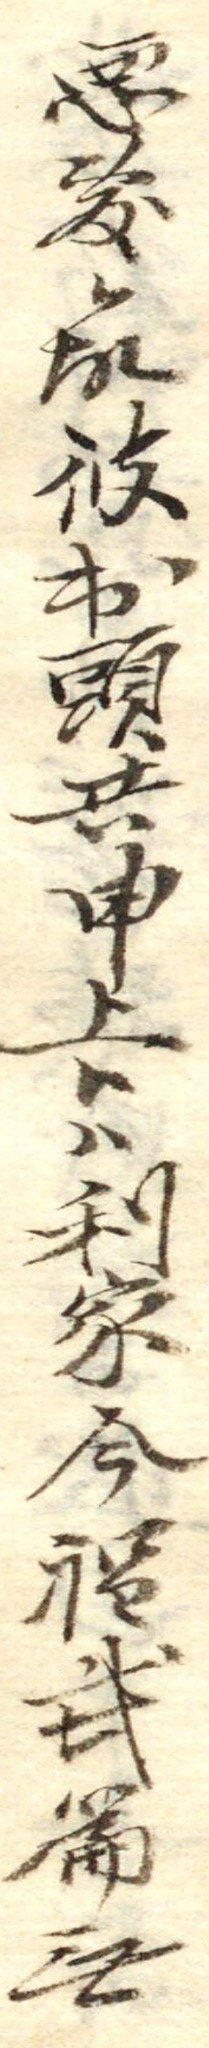悪敷候故彼出頭共申上候は利家今程武篇無
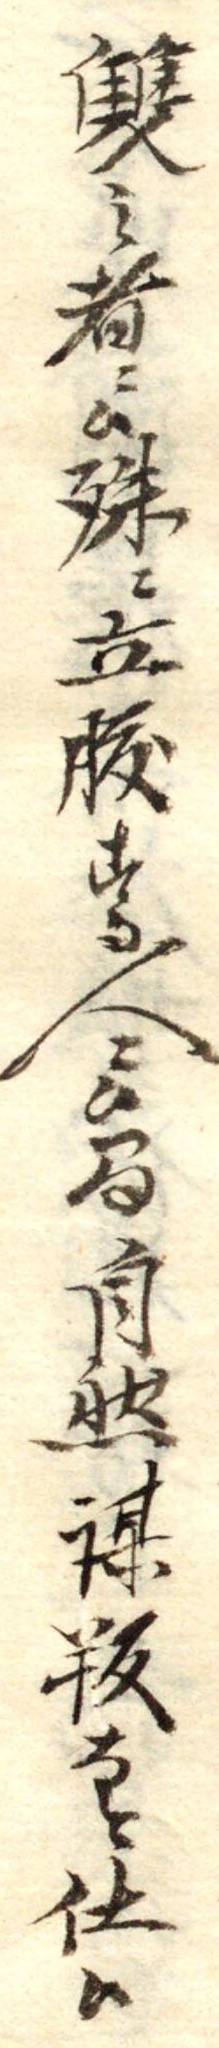双之者に候殊に立服春る人に候間自然謀叛なと仕候

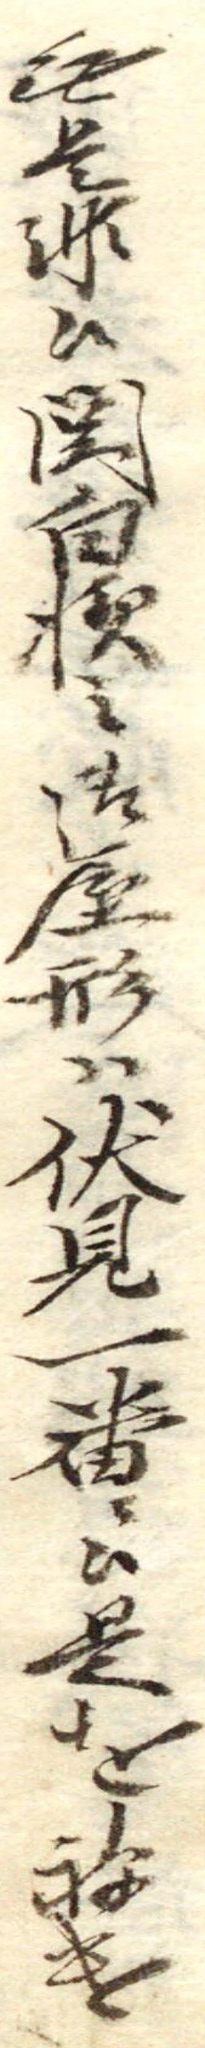無是非候関白様之御屋形は伏見一番に候是を被遣
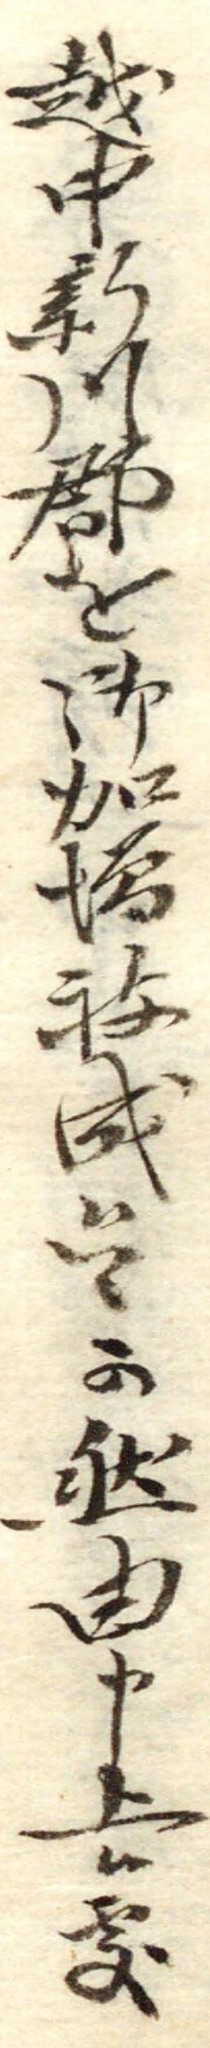越中新川郡を御加増被成候はゝ可然由申上候處
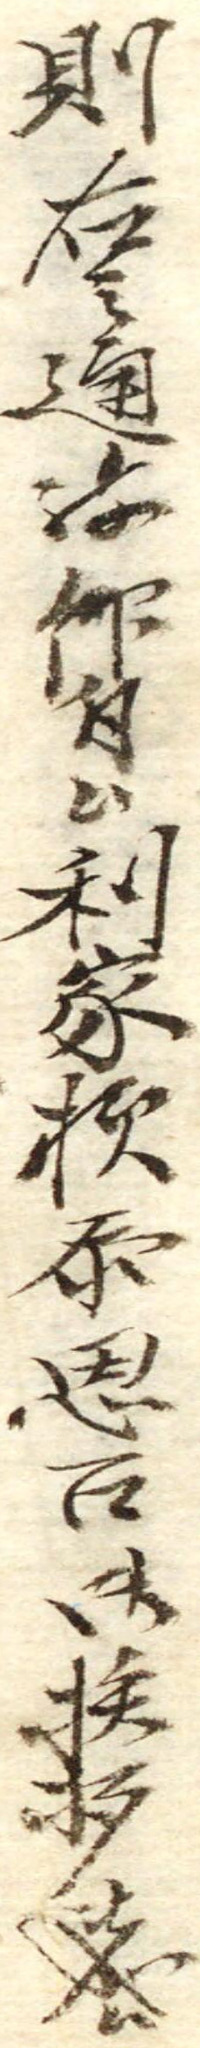則右之通被仰付候利家様忝思召御挨拶被成候
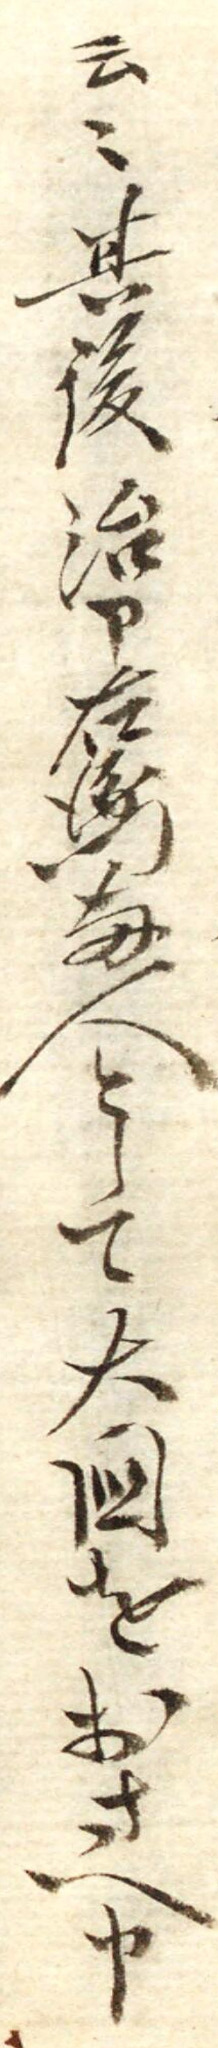云々其後治部右衛門両人として大国をおせへ申
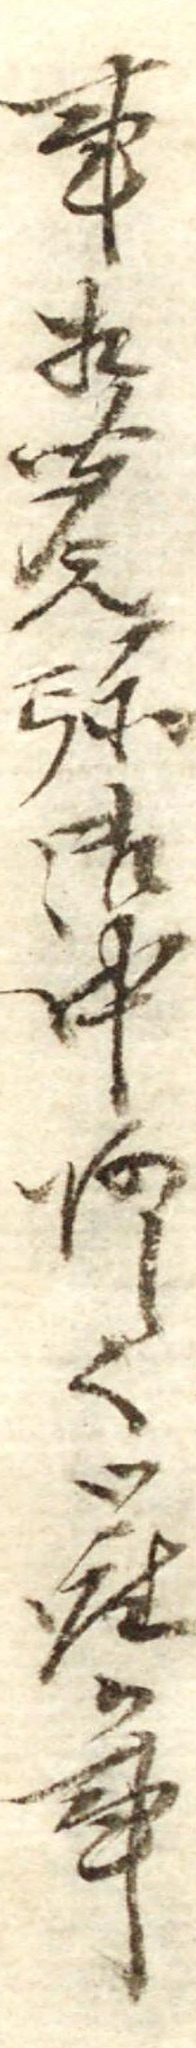事相聞こへ弥御中阿しく御座候事
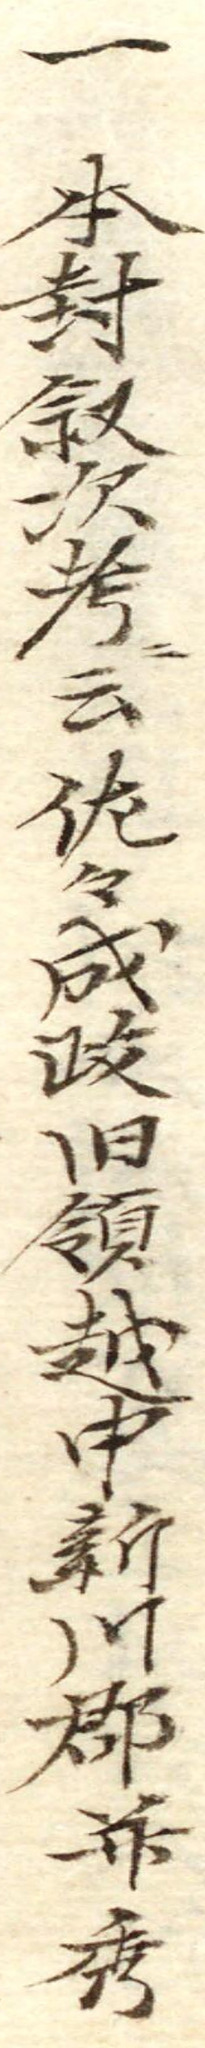一本封叙次考に云佐々成政旧領越中新川郡幷秀
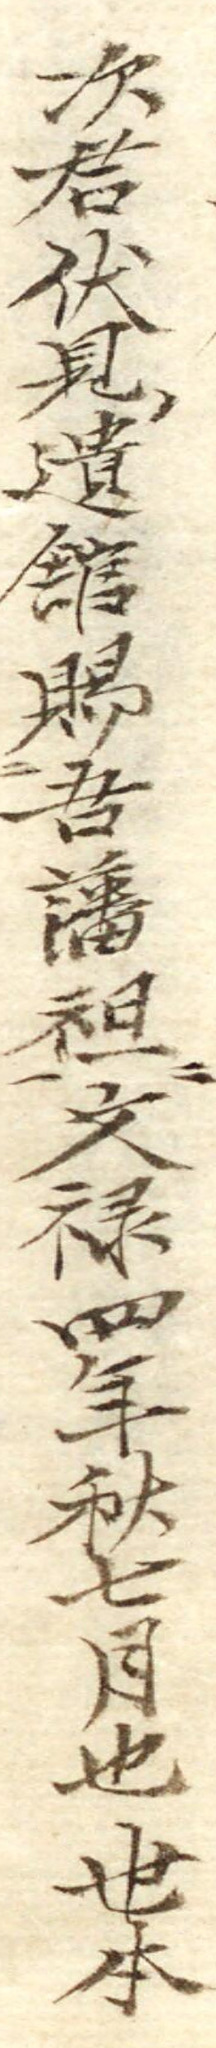次君伏見の遺舘賜吾藩祖に文禄四年秋七月也世本
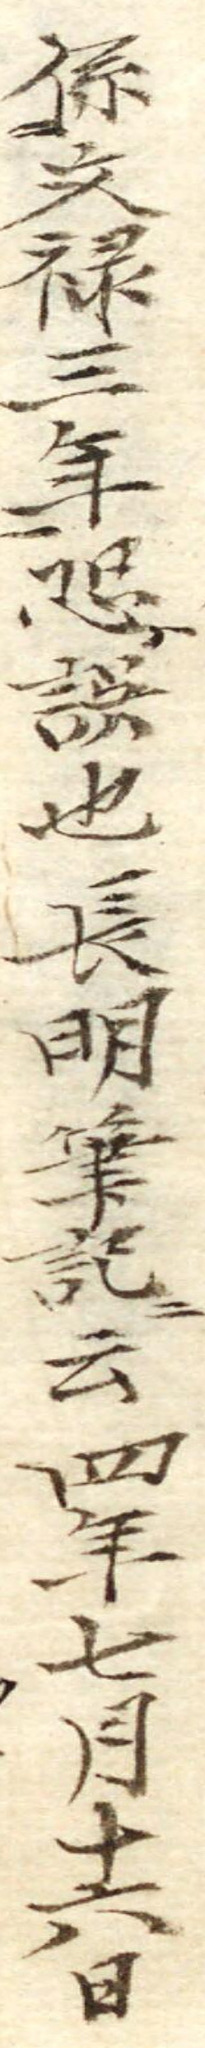係文禄三年恐は誤也長明筆記に云四年七月十六日
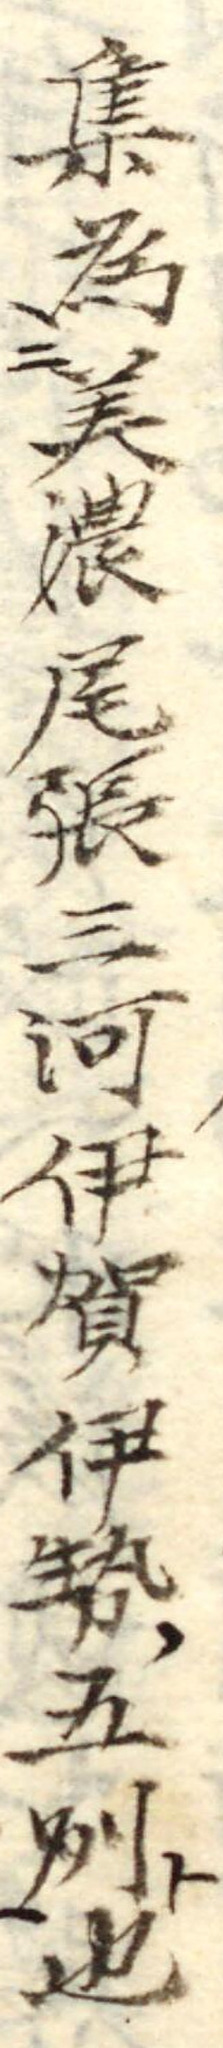集為美濃尾張三河伊賀伊勢の五洲と也
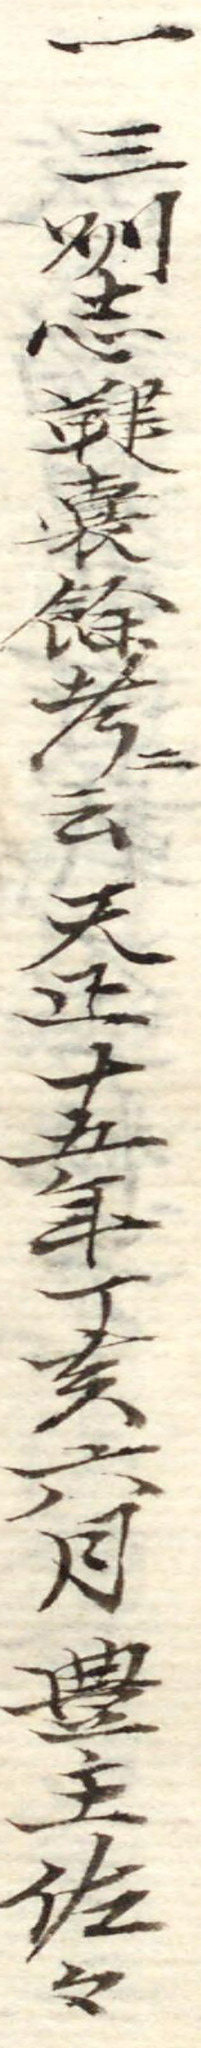一三州志鞬櫜余考に云天正十五年丁亥六月豊主佐々
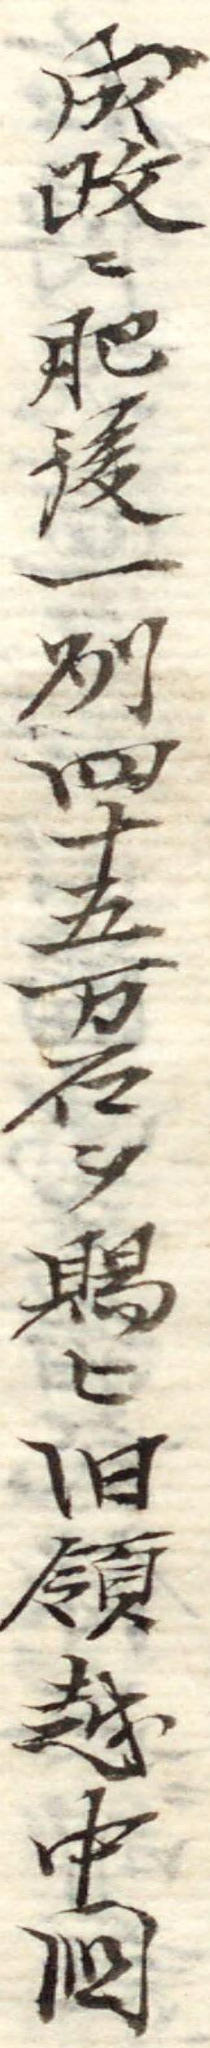成政に肥後一州四十五万石を旧領越中国
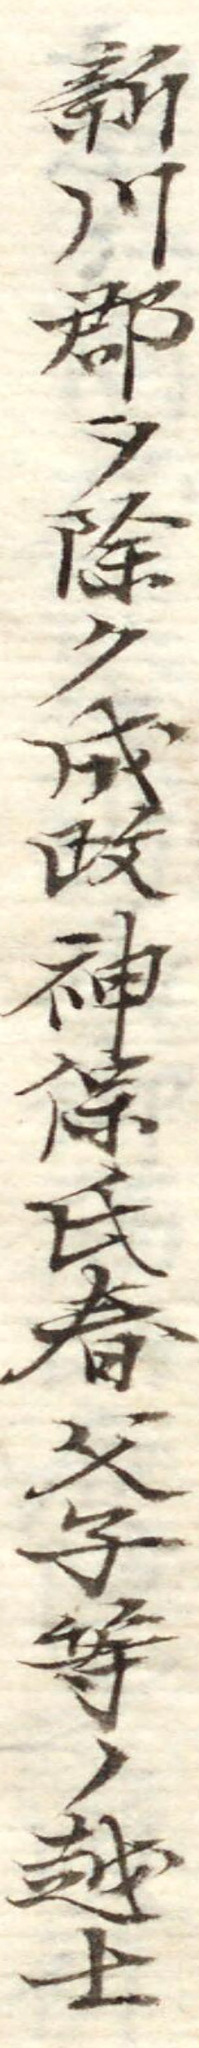新川郡を除く成政神保氏春父子等の越士
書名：前田家封国証書集録
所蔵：Ishikawa Prefectural Library
